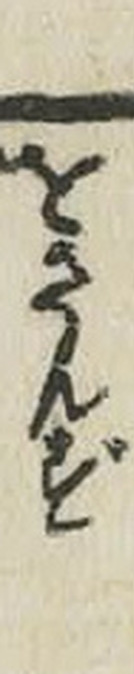をさんず
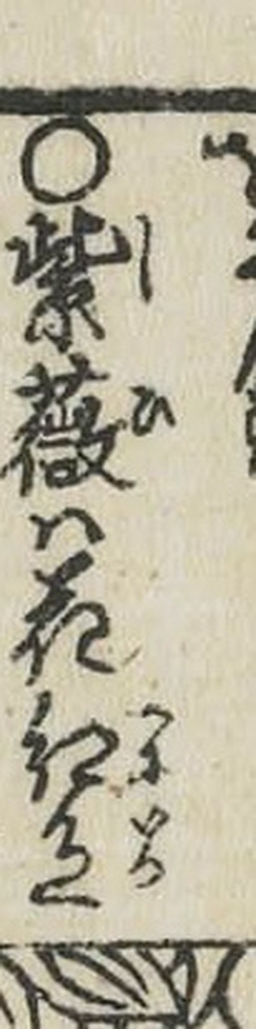○紫薇は花紅色
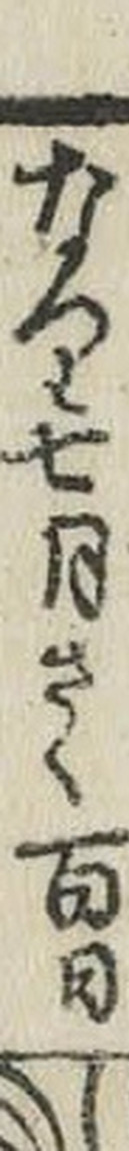なり七月さく百日
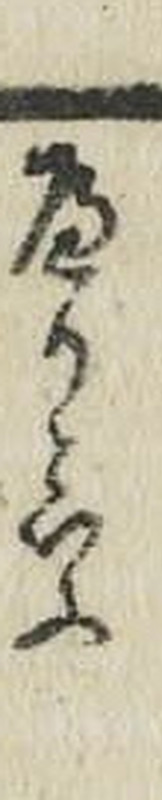へりといふ
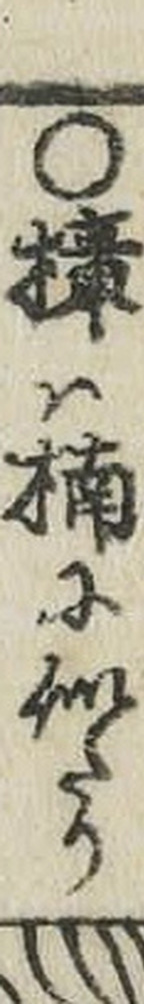○樟は楠に似たり
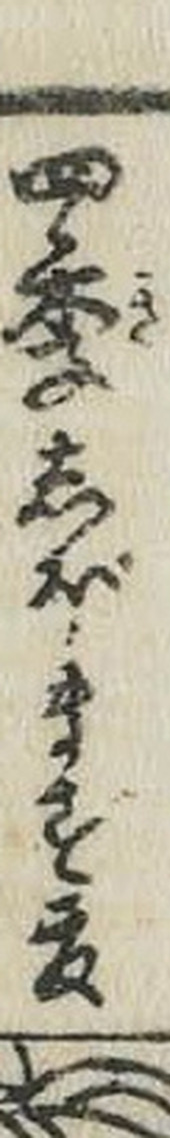四季しぼまず夏
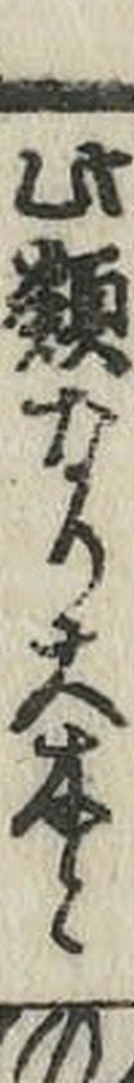此類なり大木と
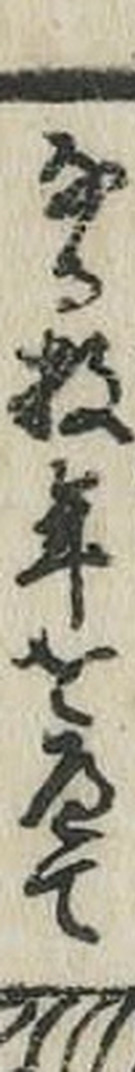なる数年をへて
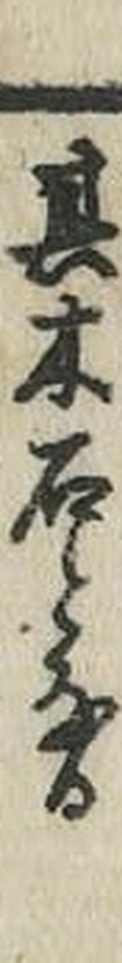其木石となる

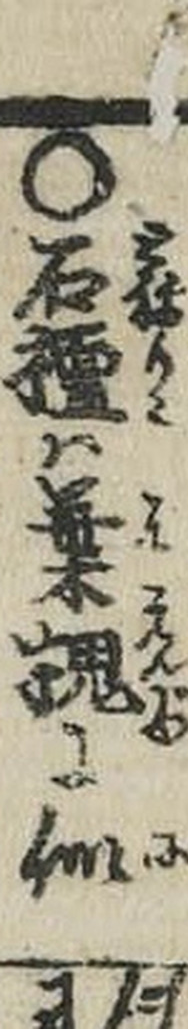○石檀は葉槐に似
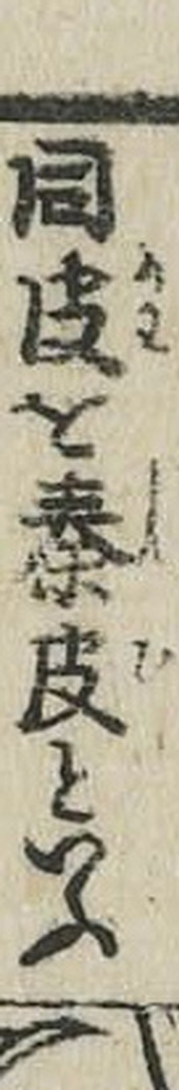同皮を秦皮といふ
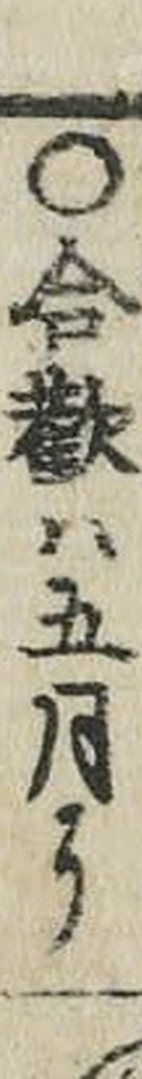○合歓は五月に
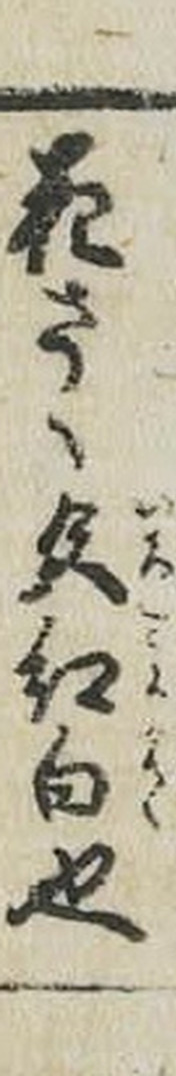花さく色紅白也
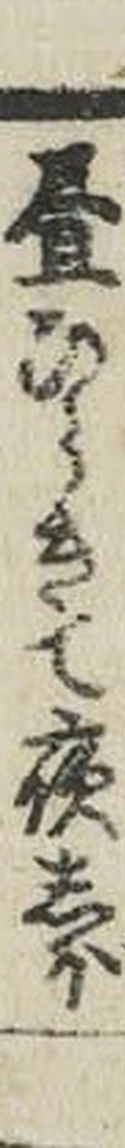昼ひらきて夜しぼ
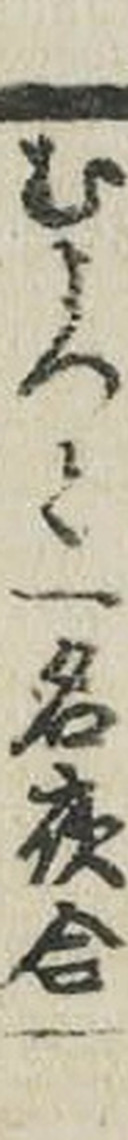むよつて一名夜合
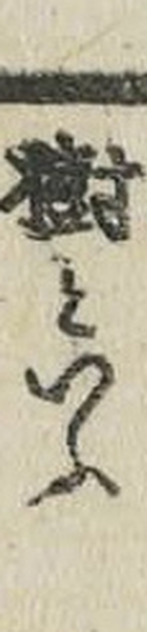樹といふ
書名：増補頭書訓蒙図彙大成 10巻 8:巻之17-19
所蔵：東京学芸大学教育コンテンツアーカイブ
